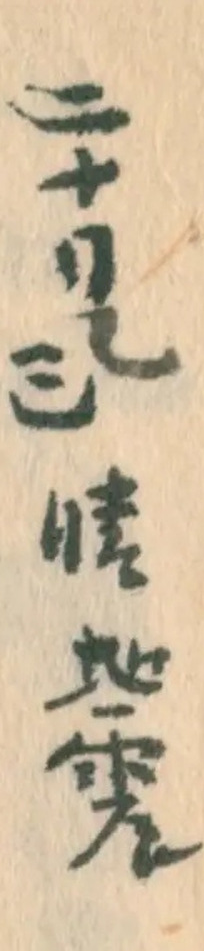二十日乙巳晴地震
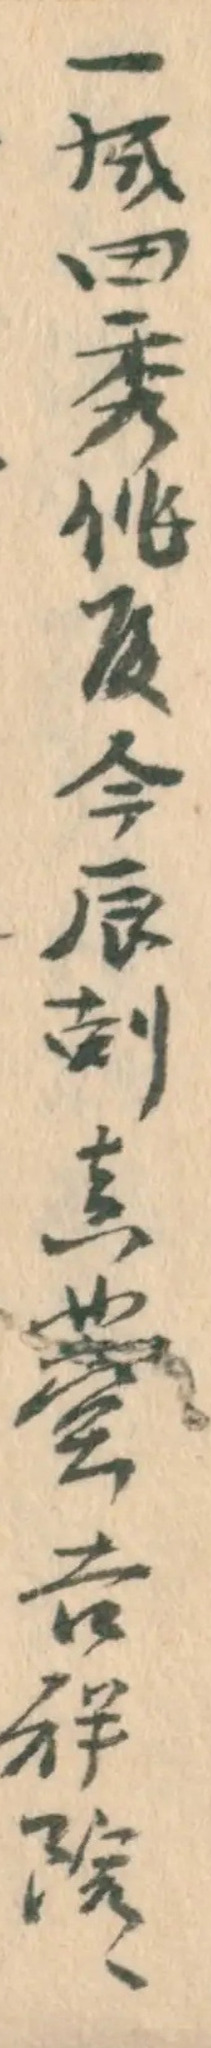一成田秀作殿今辰刻真如堂吉祥院へ
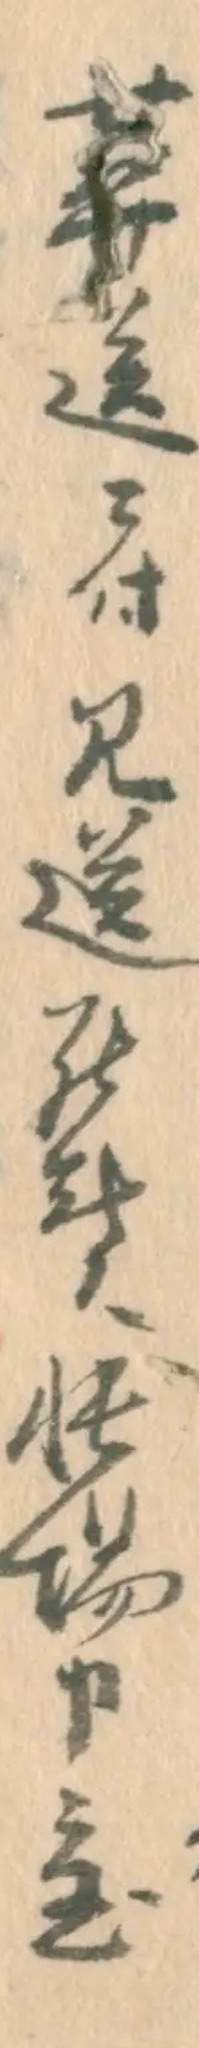葬送ニ付見送罷越ス快場申置
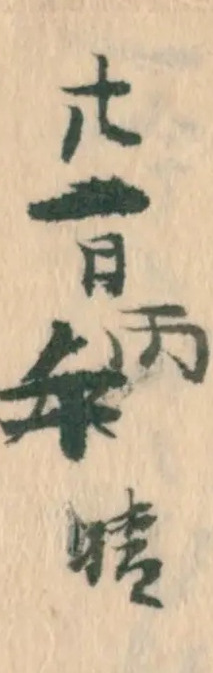廿一日丙午晴
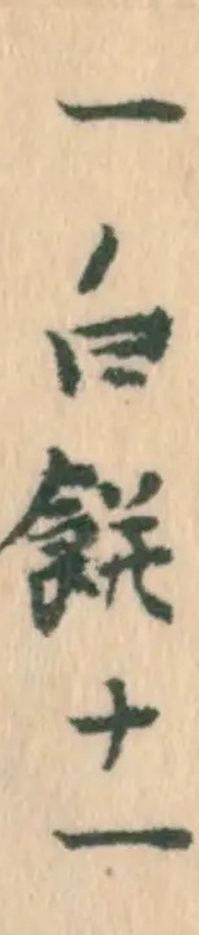一白餅十一
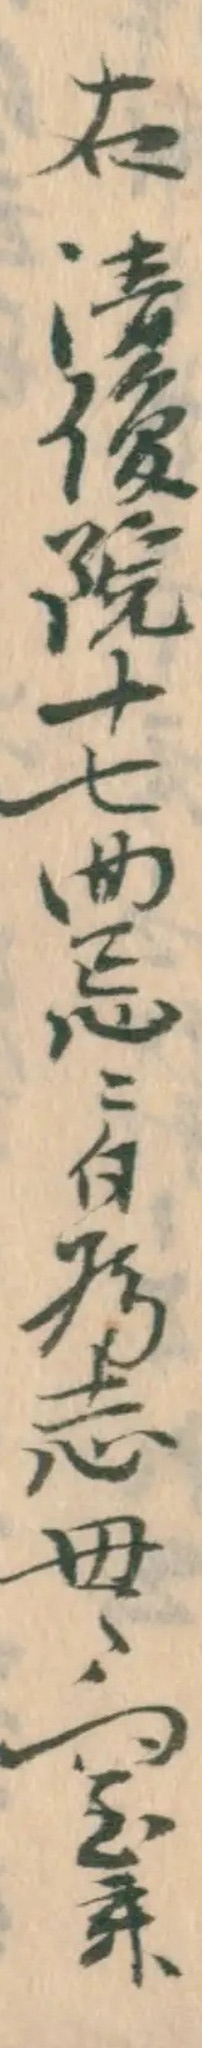右清俊院十七回忌ニ付為志母へ向到来
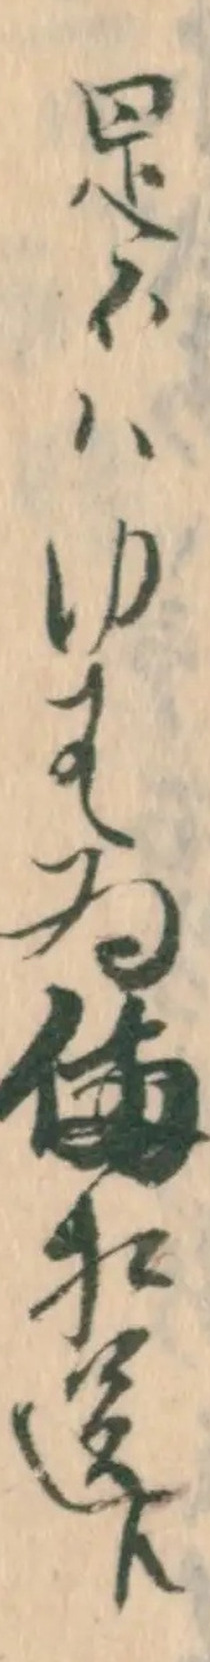是ゟハゆは為備相送ル
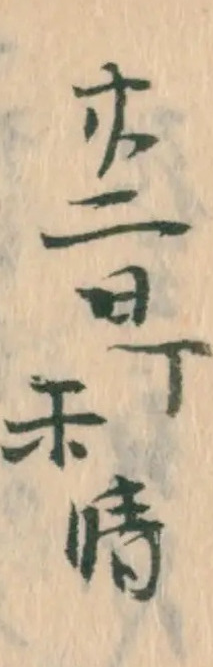廿二日丁未晴
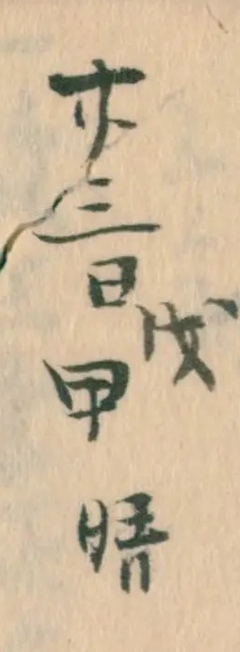廿三日戊申晴
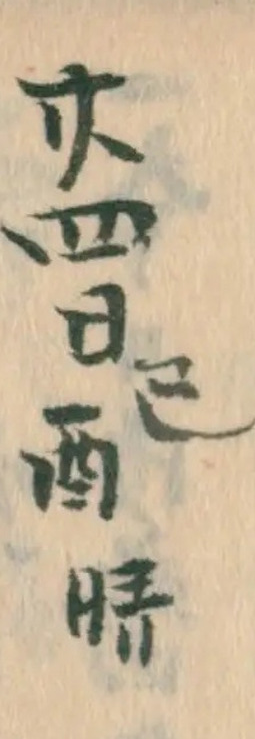廿四日己酉晴
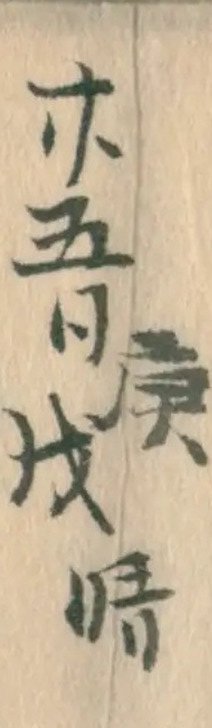廿五日庚戌晴
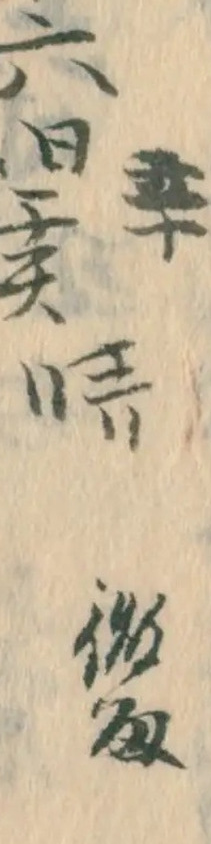廿六日辛亥晴微雨

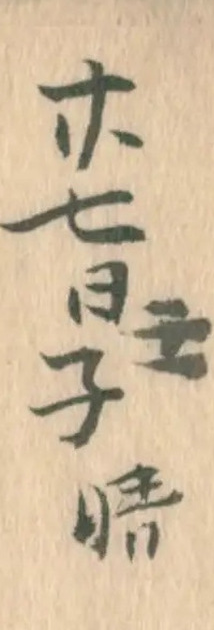廿七日壬子晴
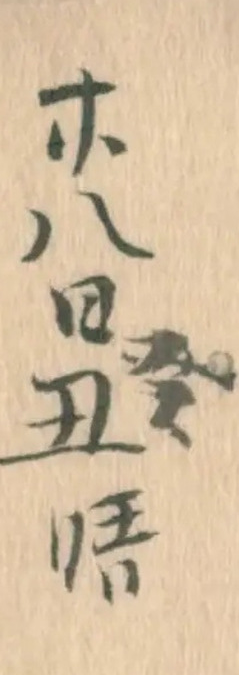廿八日癸丑晴
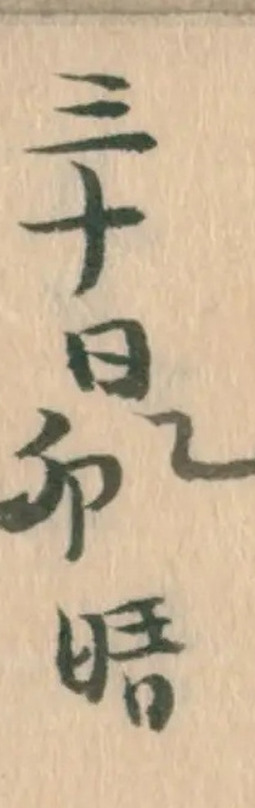三十日乙卯晴
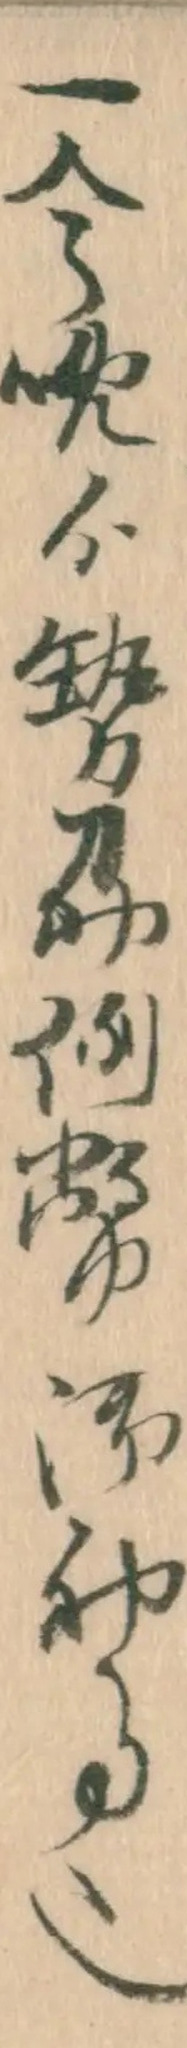一今晩ゟ勢州例幣御神事也
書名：禁裏御所御用日記. [131]
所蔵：国立国会図書館 National Diet Library, JAPAN
